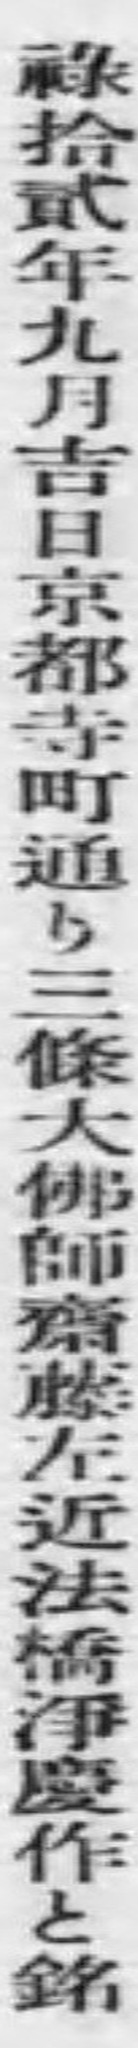禄拾弐年九月吉日京都寺町通り三条大仏師齋藤左近法橋浄慶作と銘
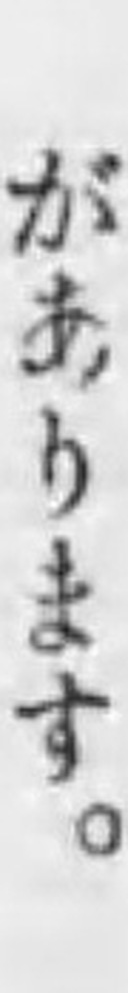があります。
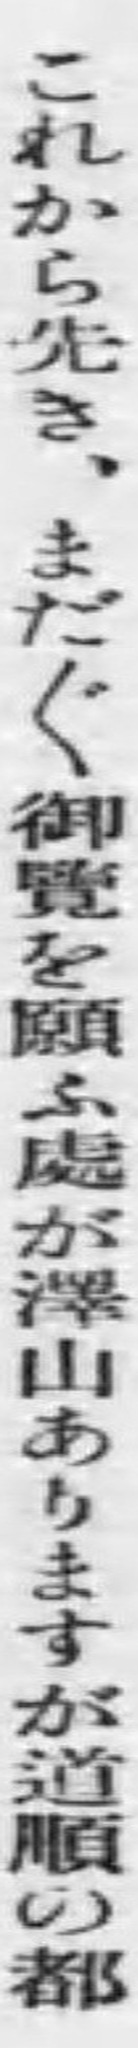これから先き、まだ〴〵御覧を願ふ処が沢山ありますが道順の都
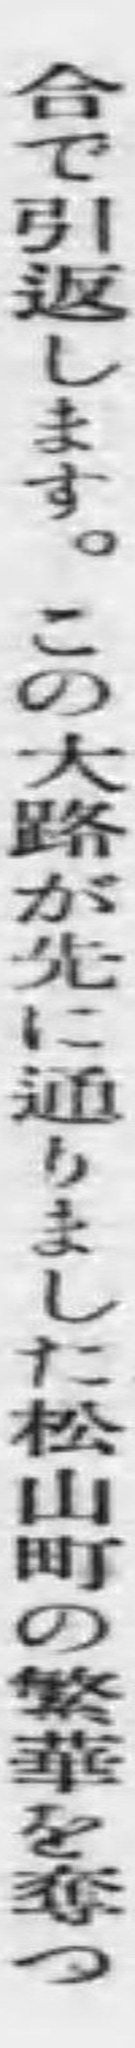合で引返します。この大路が先に通りました松山町の繁華を奪つ
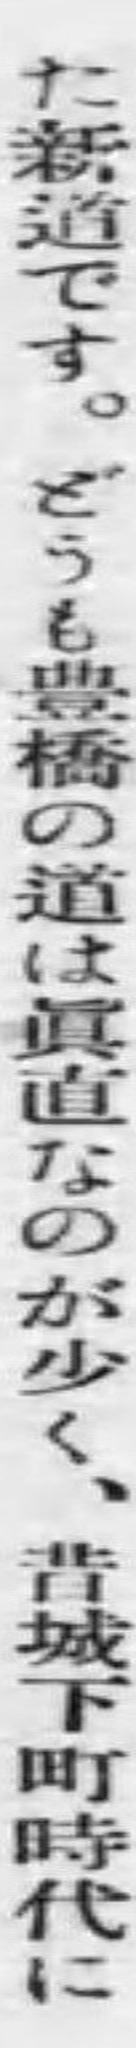た新道です。どうも豊橋の道は真直なのが少く、昔城下町時代に
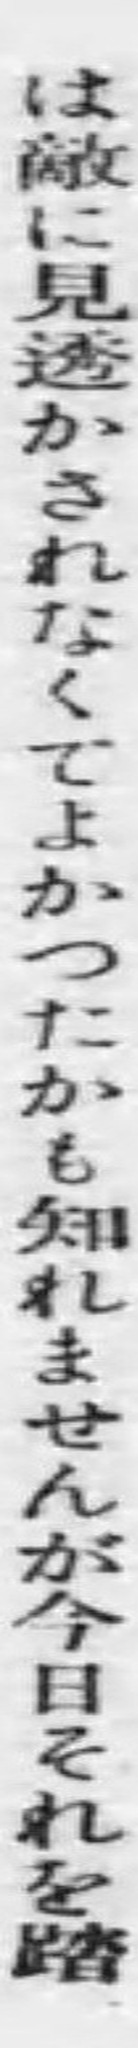は敵に見透かされなくてよかつたかも知れませんが今日それを踏
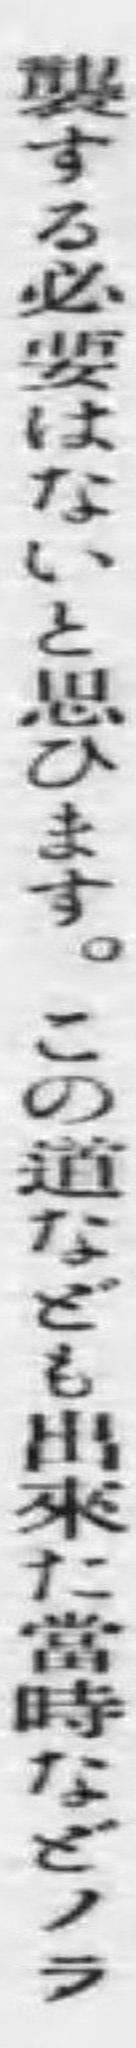襲する必要はないと思ひます。この道なども出来た当時などノラ
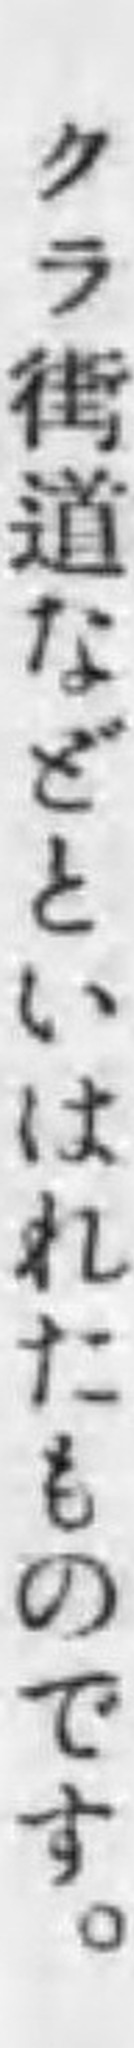クラ街道などといはれたものです
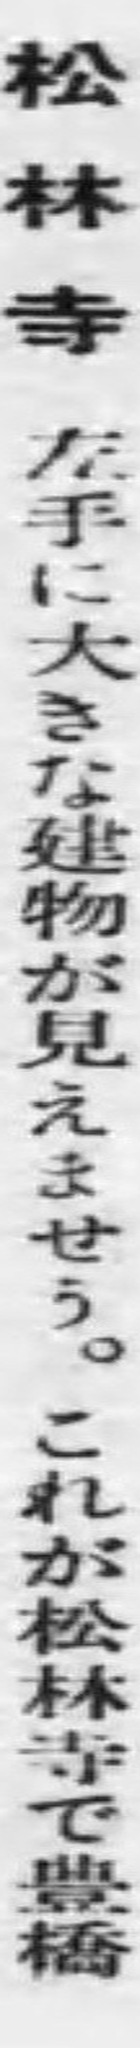松林寺左手に大きな建物が見えませう。これが松林寺で豊橋
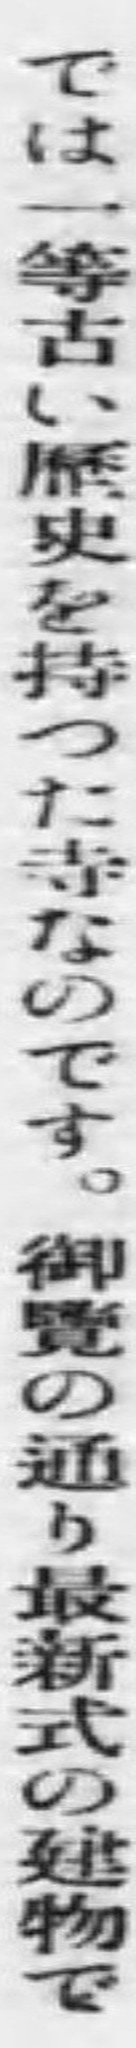では一等古い歴史を持つた寺なのです。御覧の通り最新式の建物で

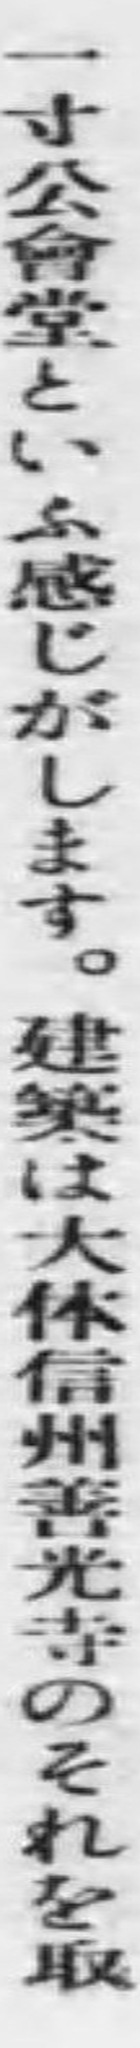一寸公会堂といふ感じがします。建築は大体信州善光寺のそれを取
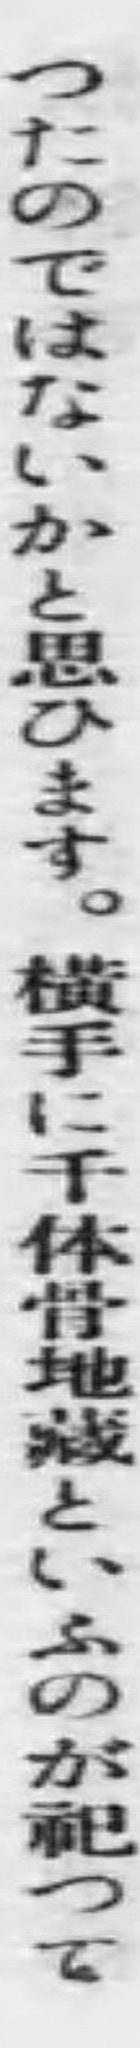つたのではないかと思ひます。横手に千体骨地蔵といふのが祀つて
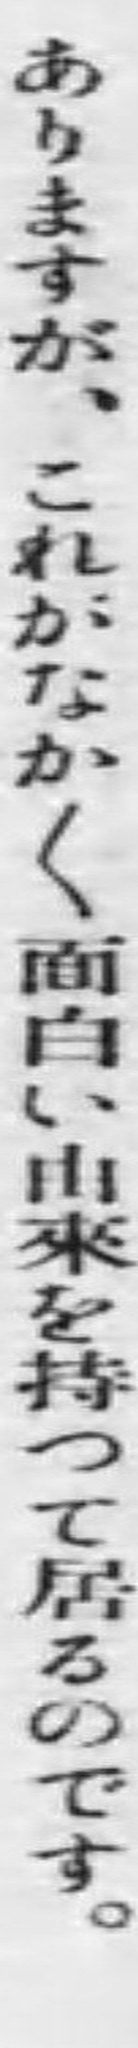ありますが、これがなか〳〵面白い由来を持つて居るのです。
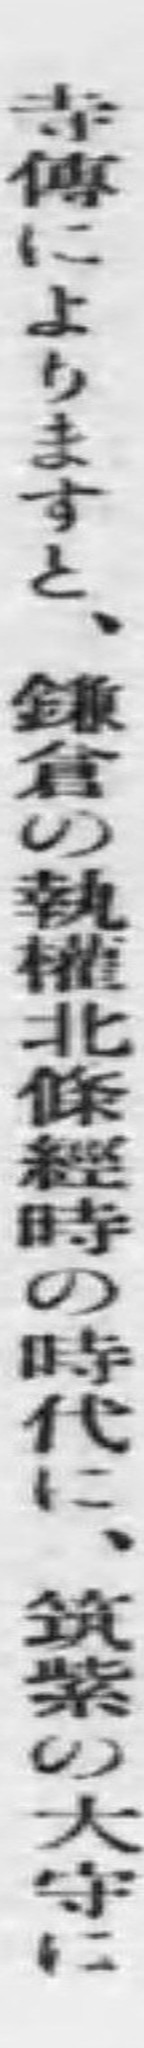寺伝によりますと、鎌倉の執権北条経時の時代に、筑紫の大守に
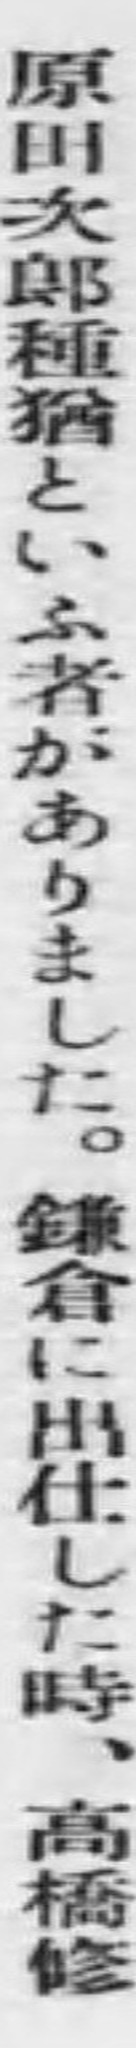原田次郎種猶といふ者がありました。鎌倉に出仕した時、高橋修
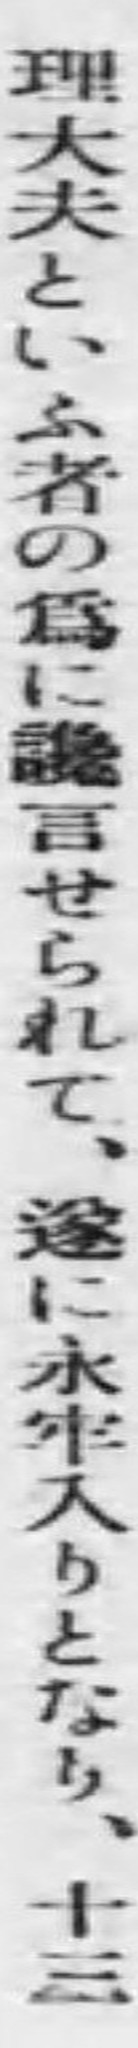理大夫といふ者の為に讒言せられて、遂に永牢入りとなり、十三
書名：東三河道中記 : 豊橋市及其附近案内
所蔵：国立国会図書館 National Diet Library, JAPAN
